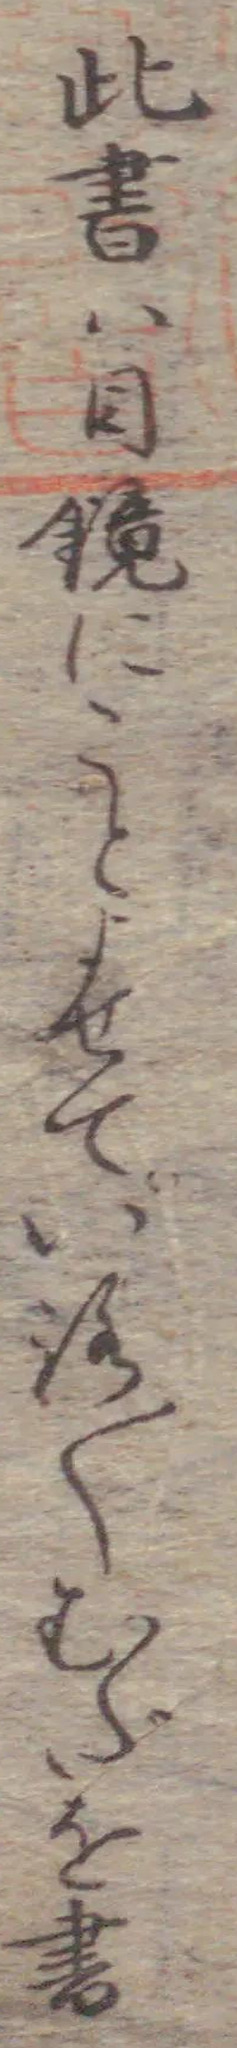此書は眼鏡にことよせていろ〳〵むだを書
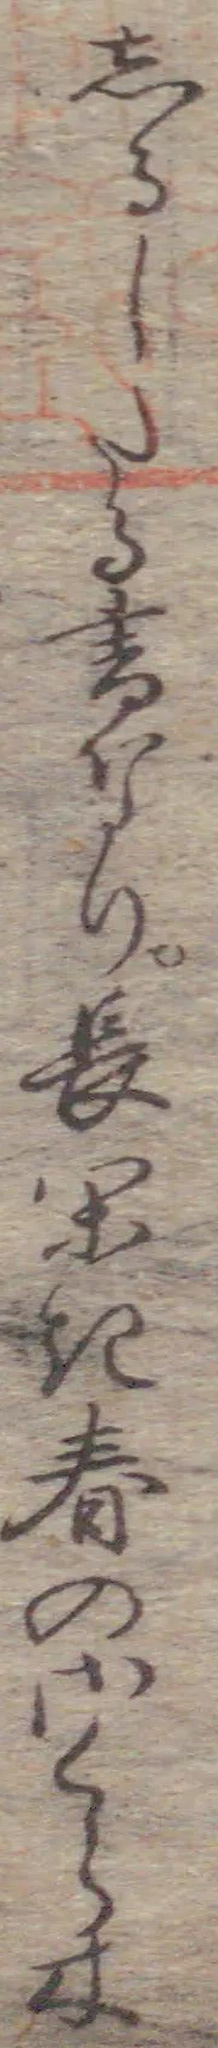しるしたる書なり。長閑き春のさくら木
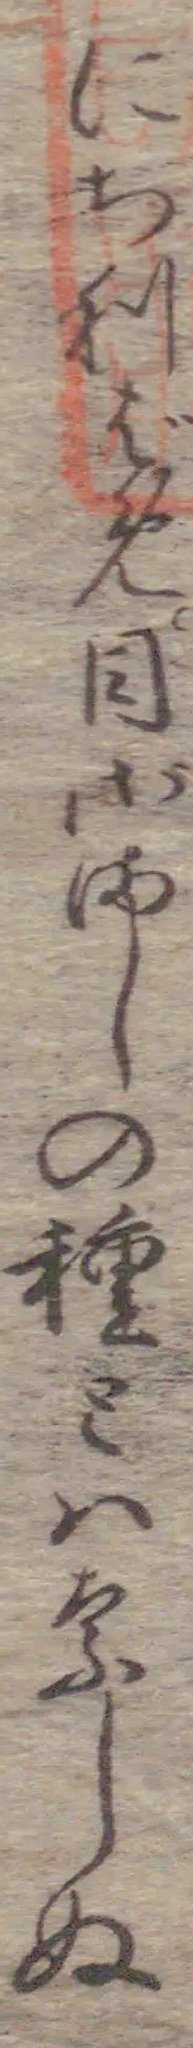にちりばめ。目さましの種とはなしぬ
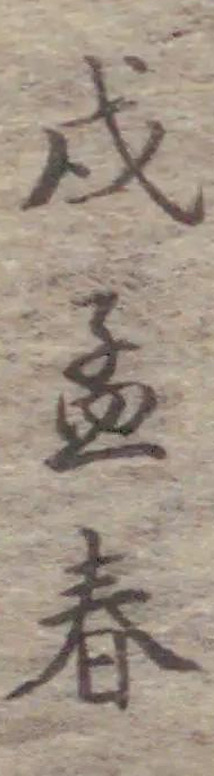戌孟春

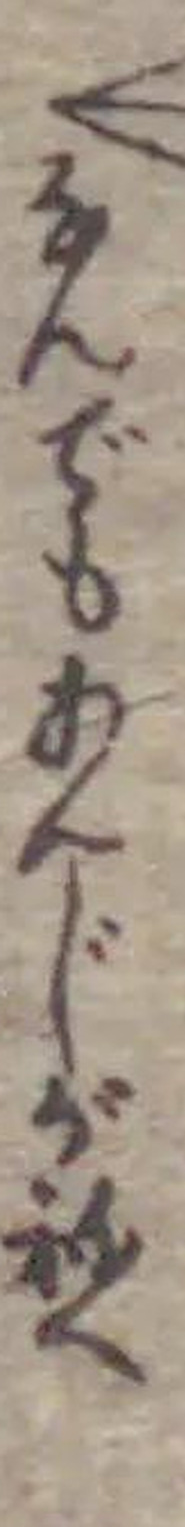なんでもあんじがねへ
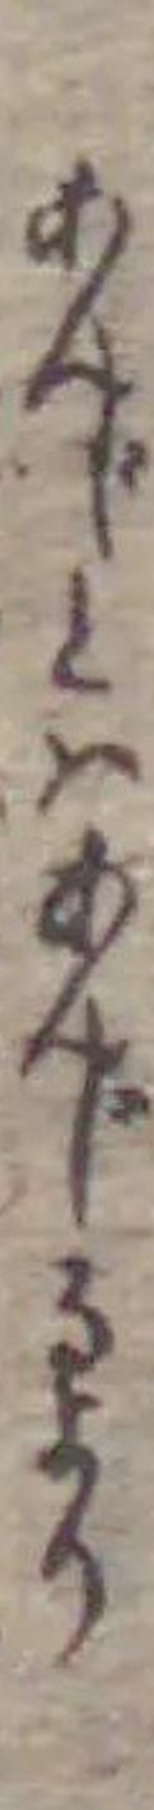あんじとはあんじるより
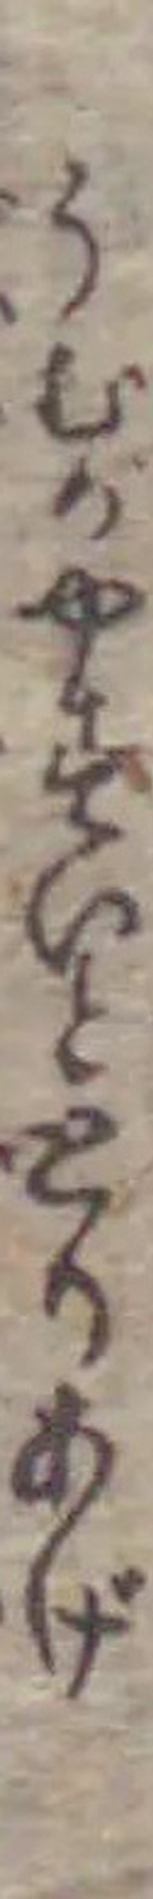うむがやすいととりあげ
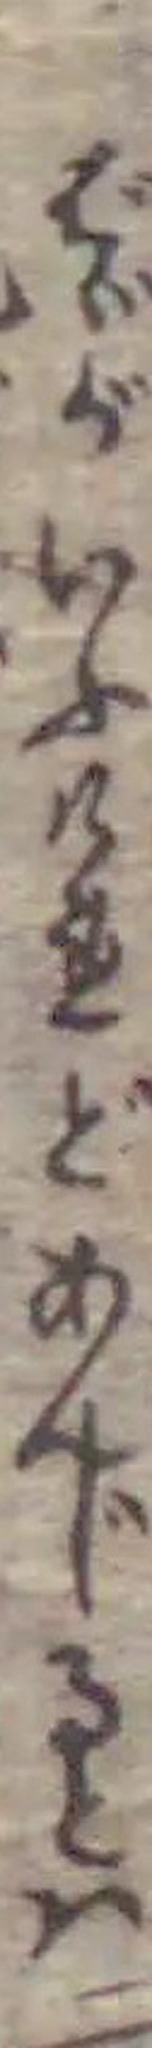ばゞがいふけれどあんじるとは
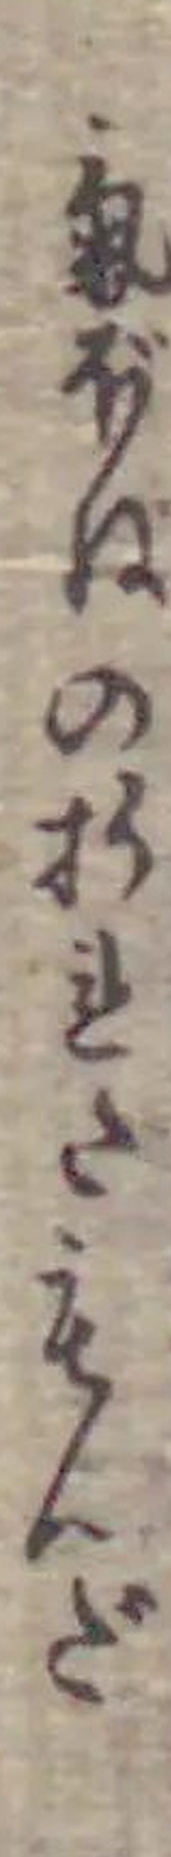気ぼねの折れたもんだ
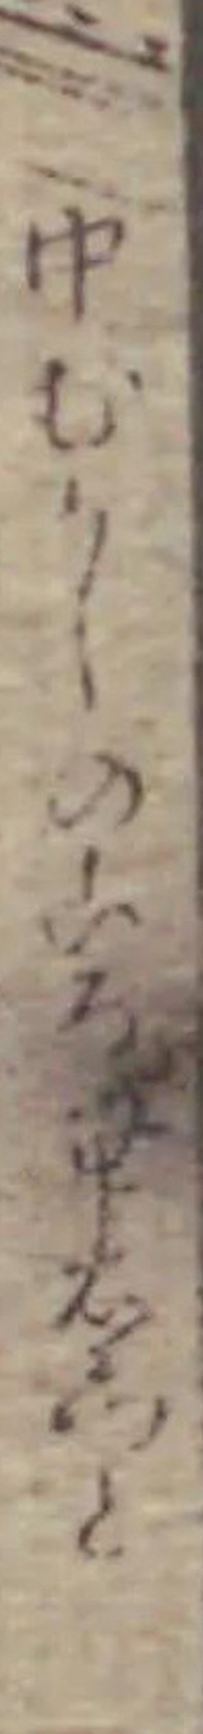中むかしのころ幸右衛門と
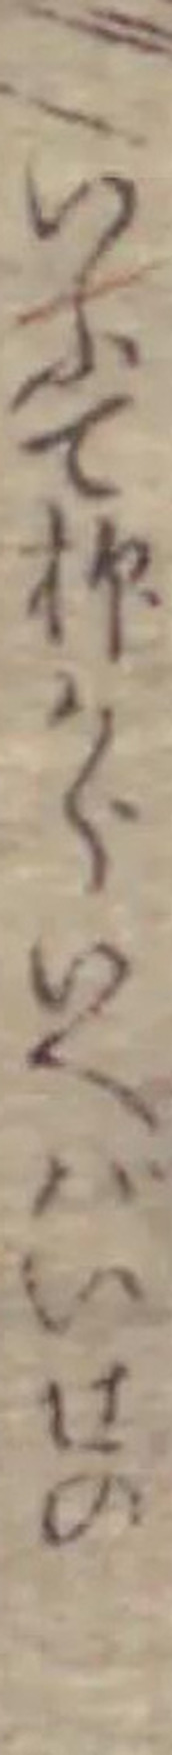いふて抑からいへばいせの
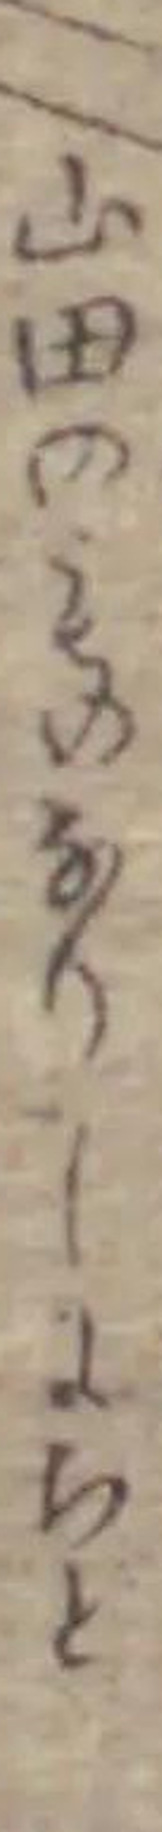山田のものなりしにちと
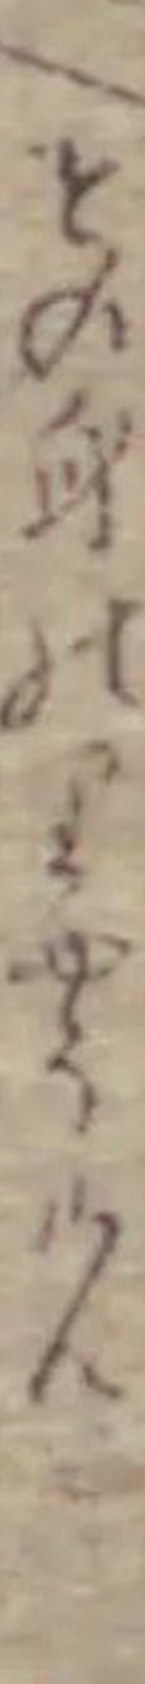その身のりやうけん
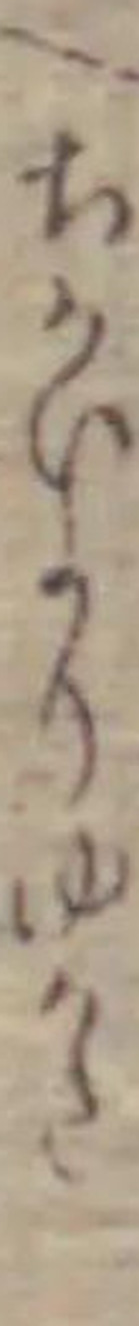ちかいよりゆかた
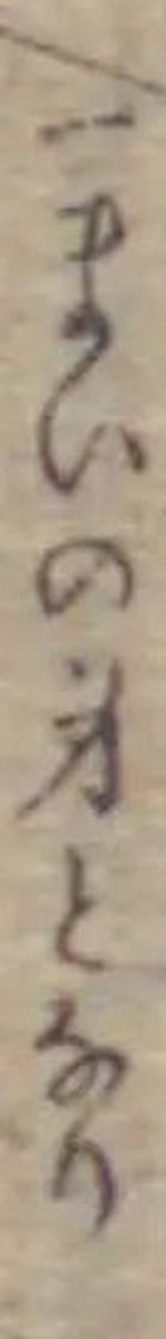一まいの身となり
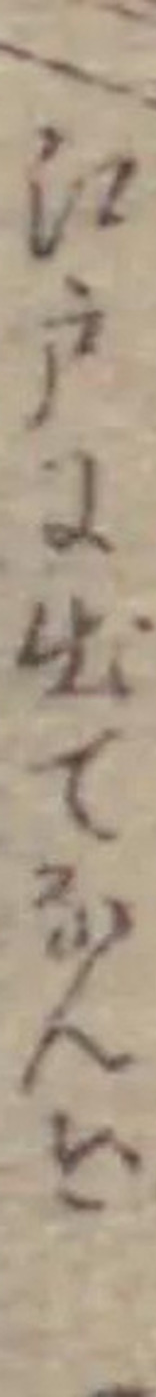江戸に出てなんそ
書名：栄増眼鏡徳 3巻
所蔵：国立国会図書館 National Diet Library, JAPAN
